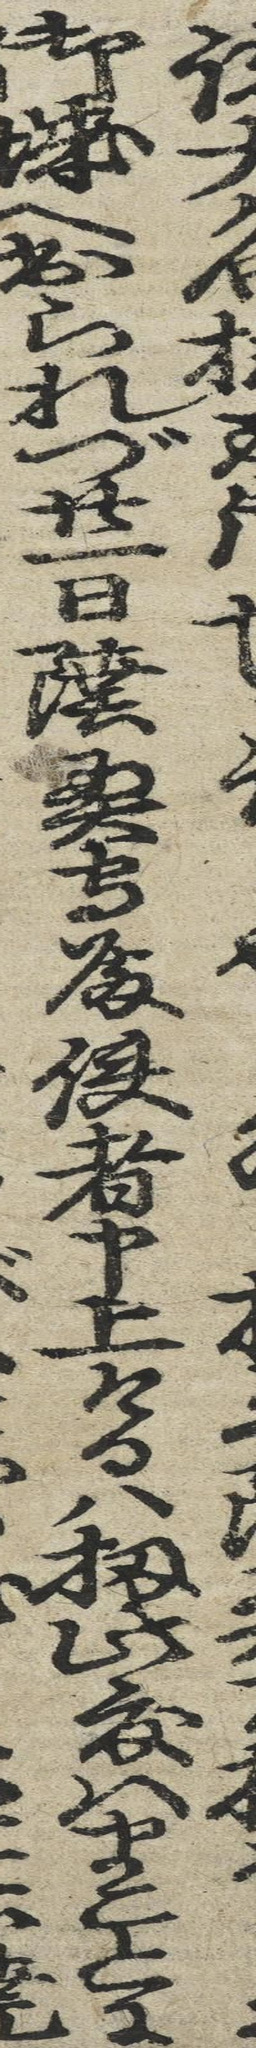御城へ出られづ廿一日陸奥守殿使者申上けるは扨此度はまことに
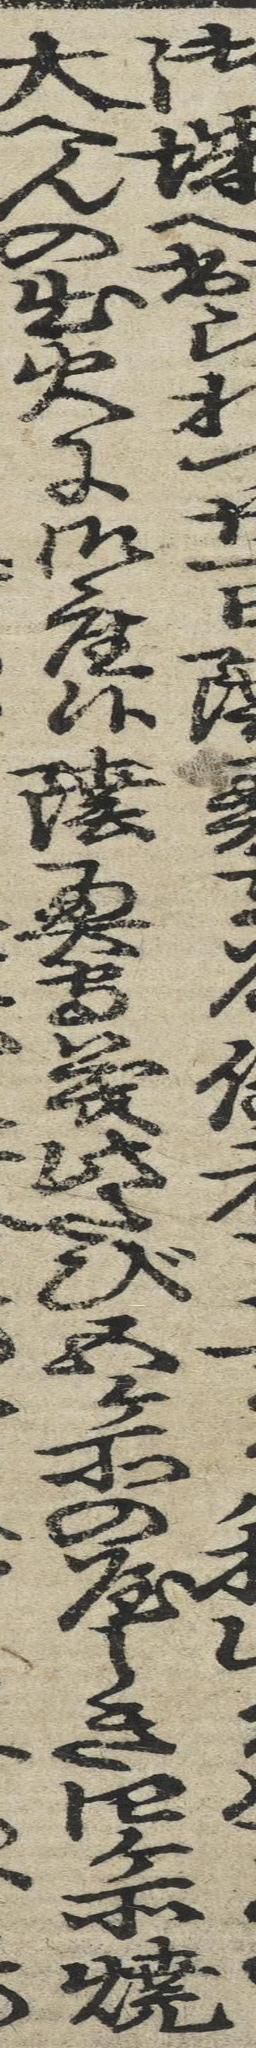大へんの出火に御座候陸奥守も此たび五ヶ所の屋しき四ヶ所焼
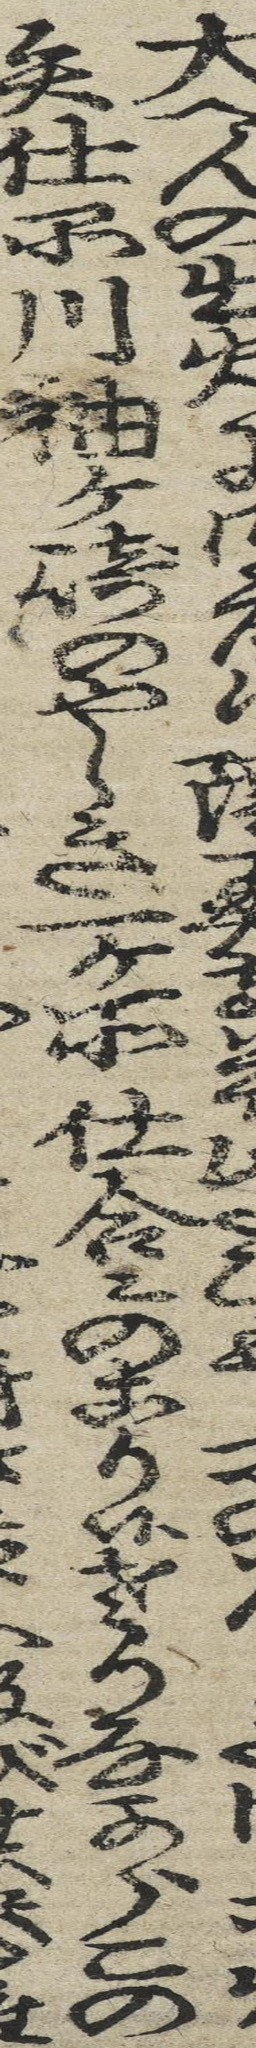失仕品川袖ヶ崎のやしき一ヶ所仕合にのこり候さりなからこの
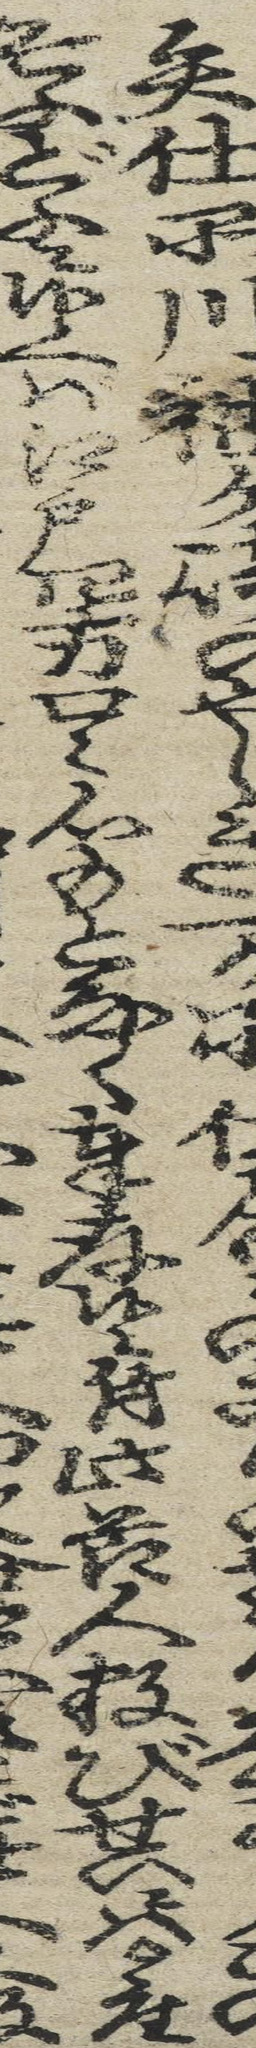そふどふに候へば江戸四方口〻心もとなく奉存候に付此節人数びせいには御座
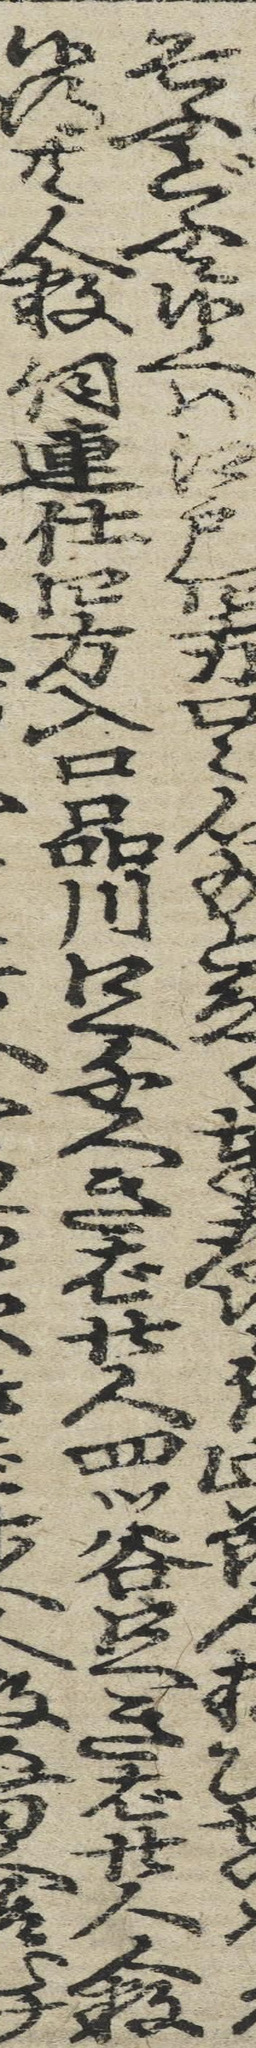候得共人数何連仕四方入口品川口へ千人きば廿人四ツ谷口へきば廿人人数
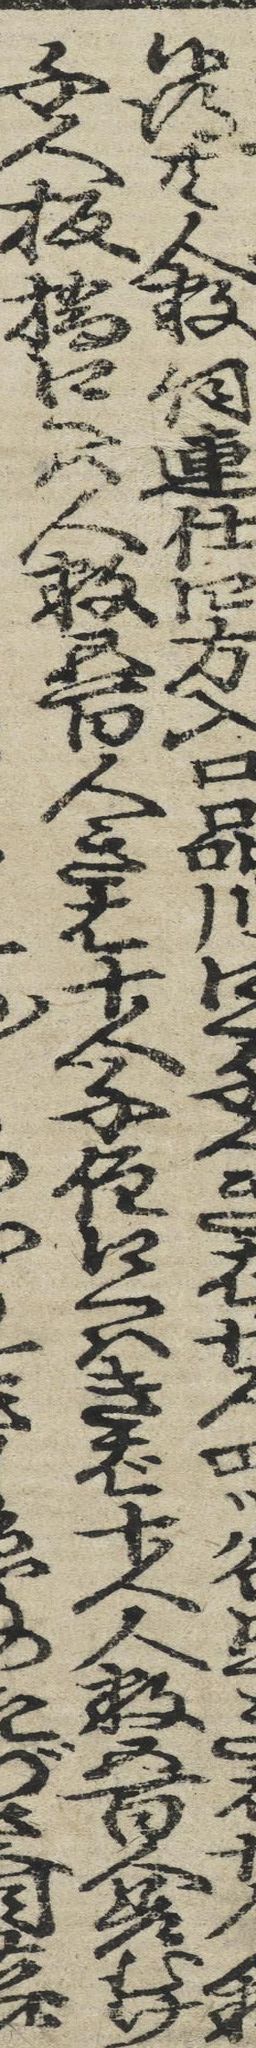千人板橋口へは人数五百人きは十人千住口へはきば十人人数五百人差むけ
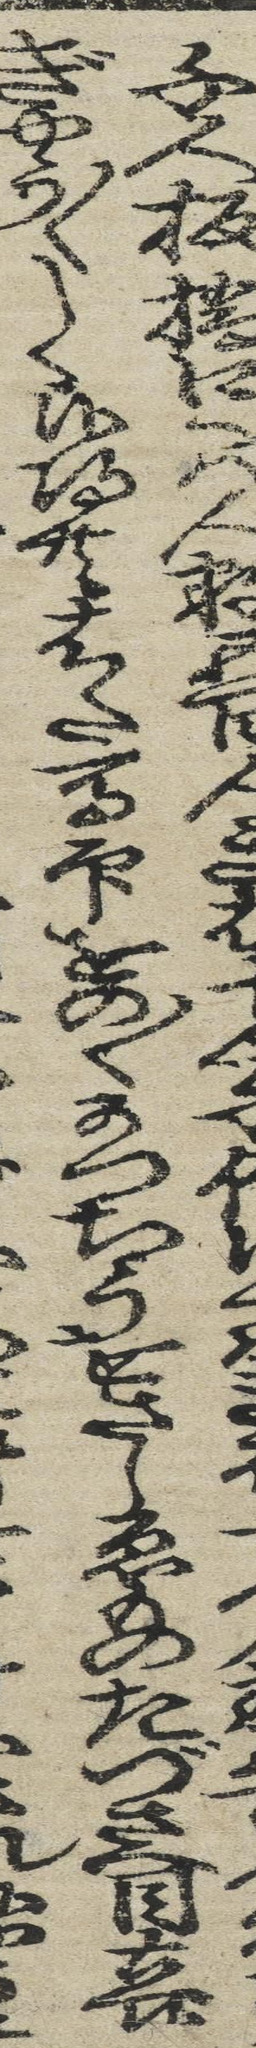ぎやう〳〵しく候得共はた馬印をのくかつちうをさしゑものたづさへ目立候
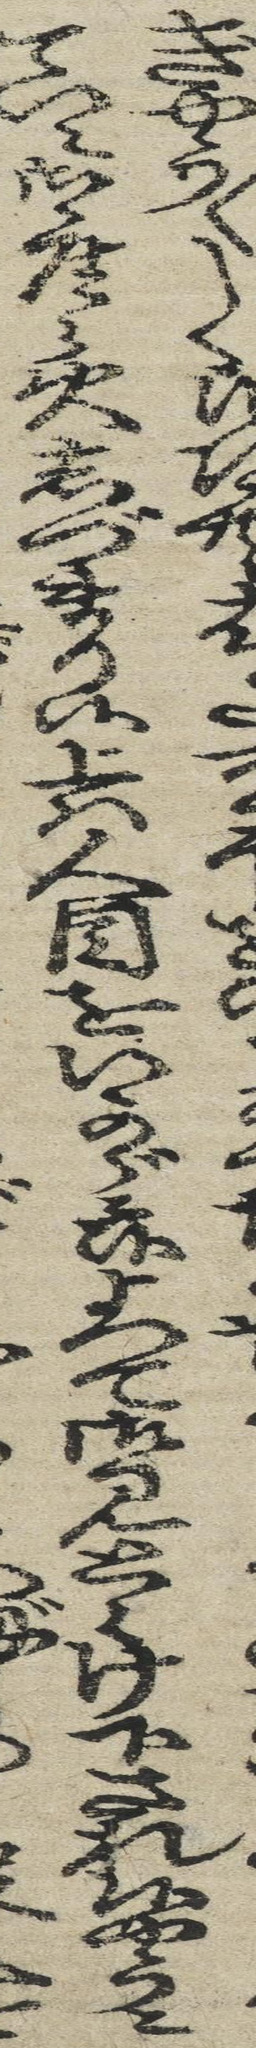ていに御座候火しづまり候上は人目をいかゞに候よつて御見とゝけ下され候やうに
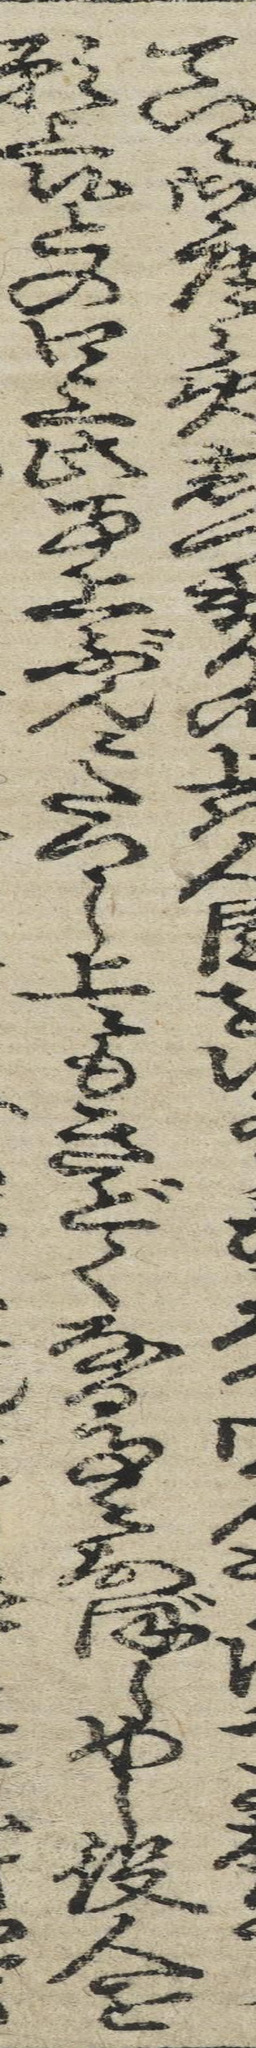願上候との口上此事上ぶんにたつし上にもきどくなる事におぼしめし役人を
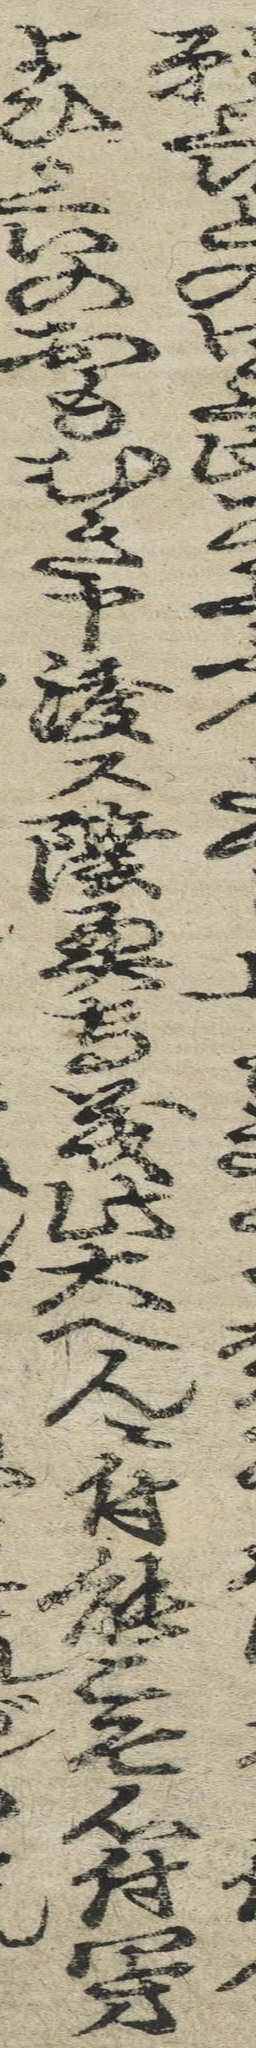よひ上いのおもむき申渡す陸奥守も此大へんに付能こそ心付四方
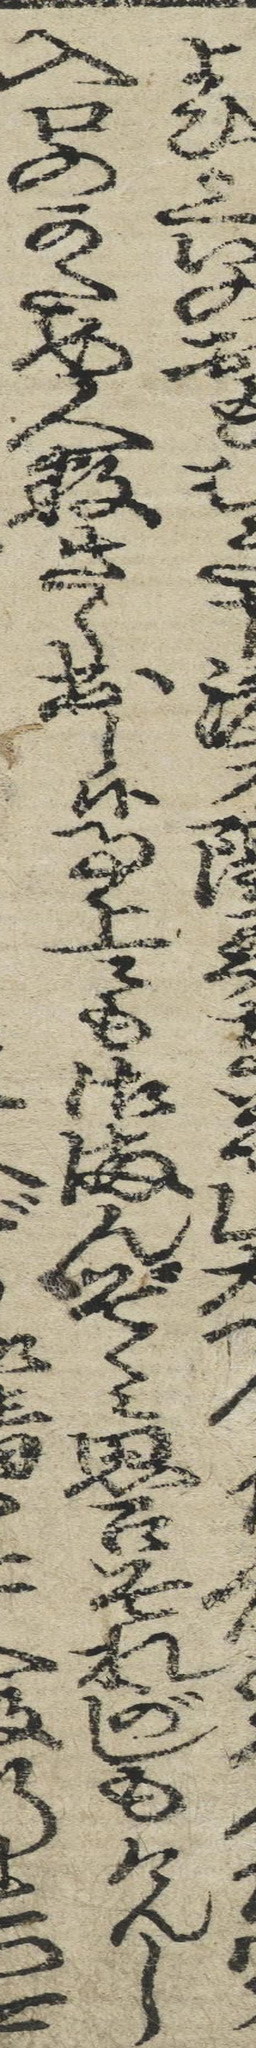入口のかたや人数さくおし候事上にも御まんぞくに思召それがしもけんし
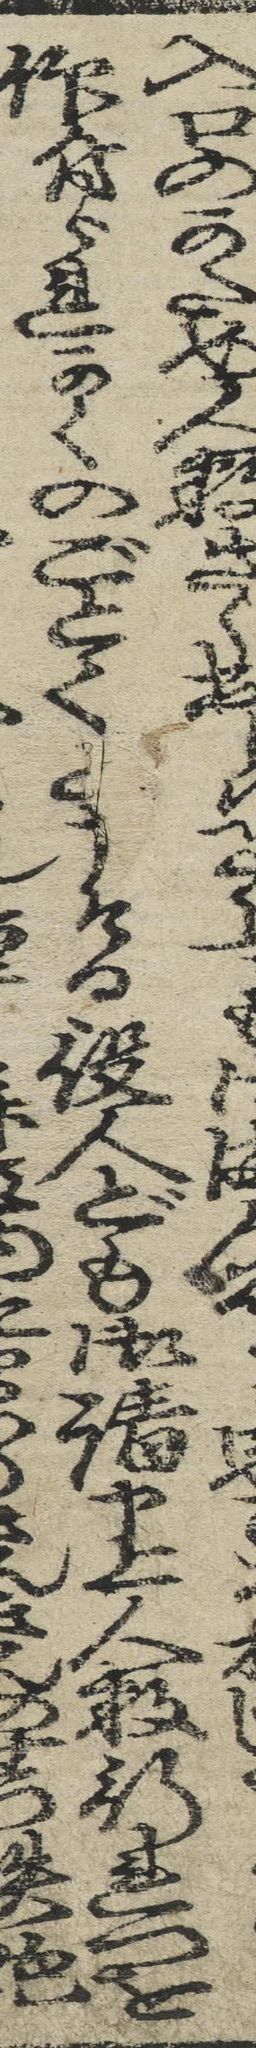仰付られかくのごとくと申ける役人ども御請申上人数行れつを
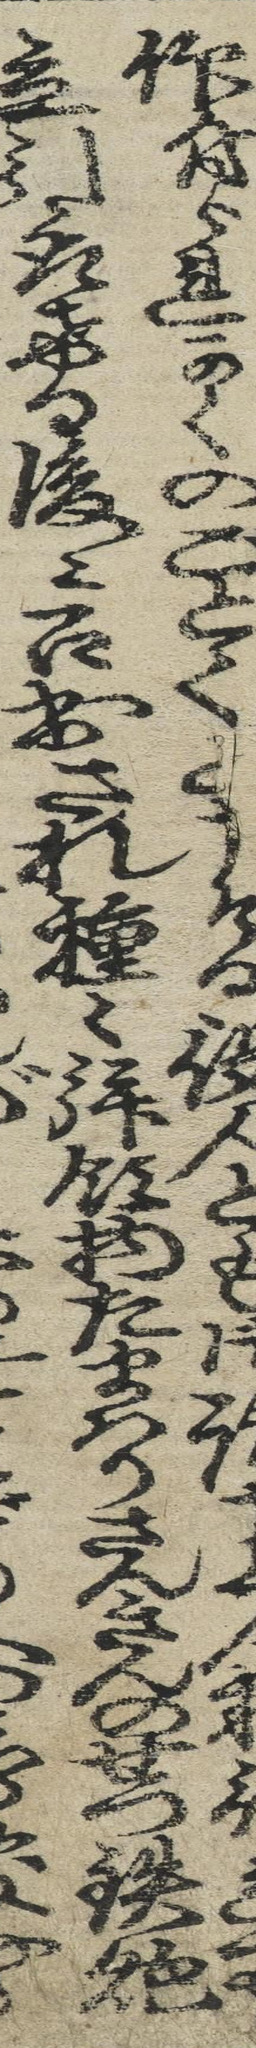立引取ける後に召出され種〻拝領物たまはりさんきんのせつ鉄砲
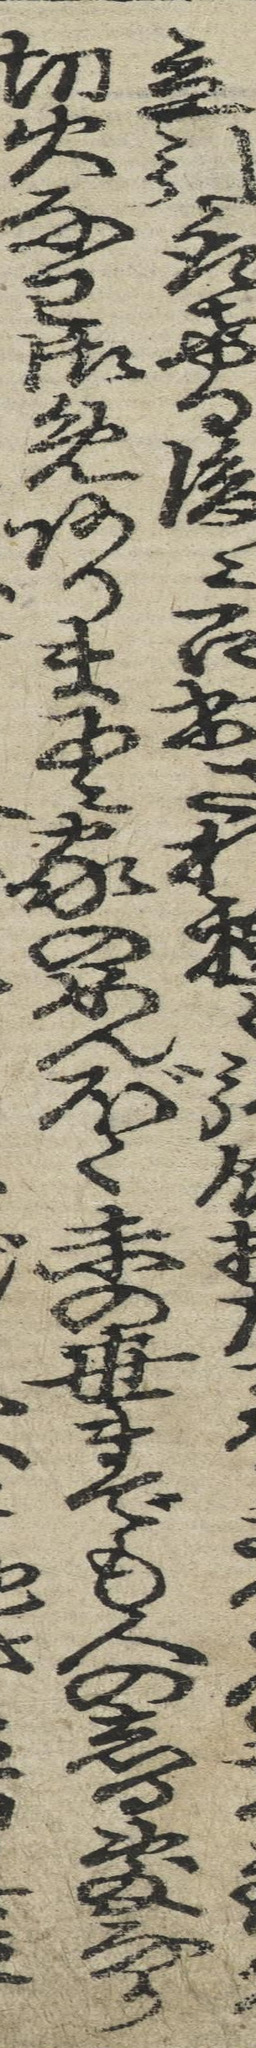切火なわ御免ありま事に家のめんぼく末の世までも人のしる敷なり
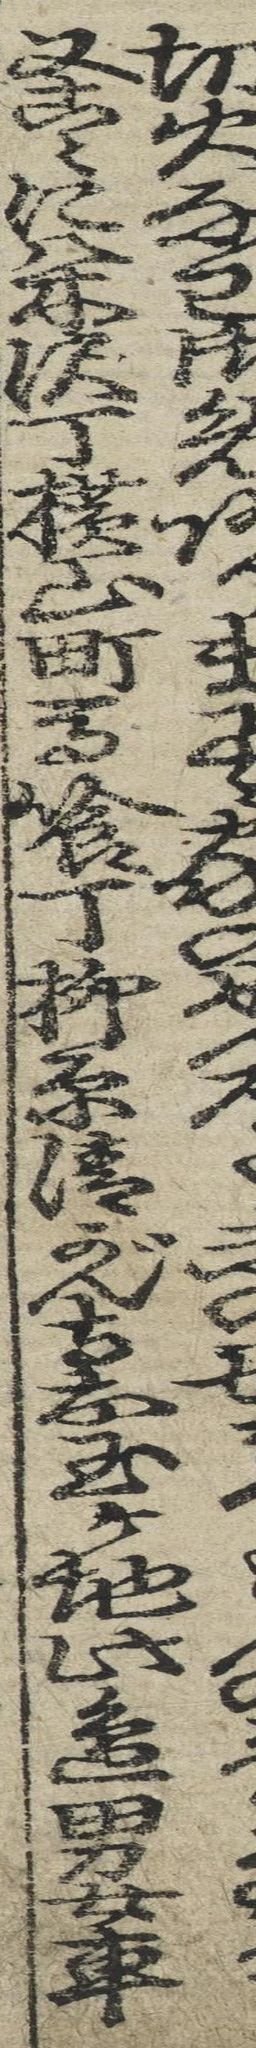又こゝに八木沢丁横山町馬喰丁柳原清がん寺東玉ヶ池此辺男女車

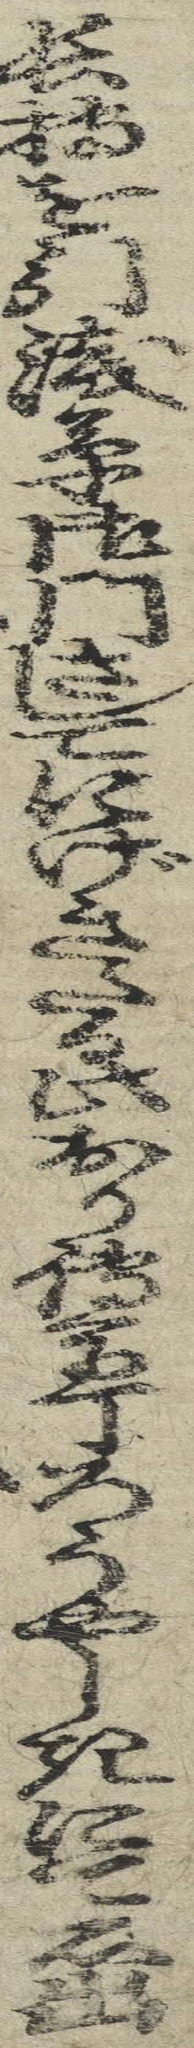長持を引浅草御門さしてにげきたる此なり伝馬丁ろうやしきにて石出
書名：[明暦大火に関する冊子]
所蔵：東京大学地震研究所図書室 Earthquake Research Institute Library, The University of Tokyo, JAPAN
